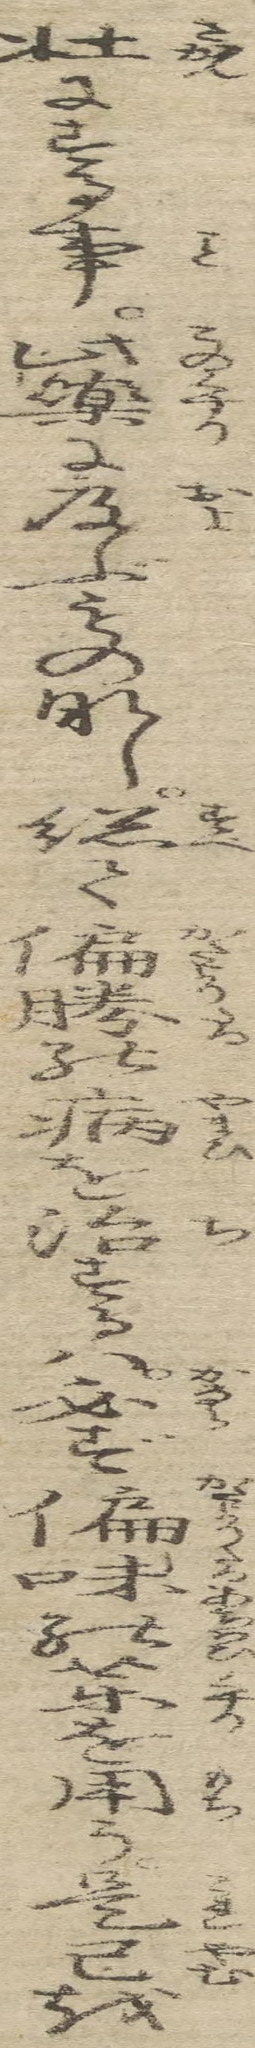壮にする事。此-薬に及ぶものなし。総て偏勝の病を治するは。必ず偏-味の薬を用う。是已を
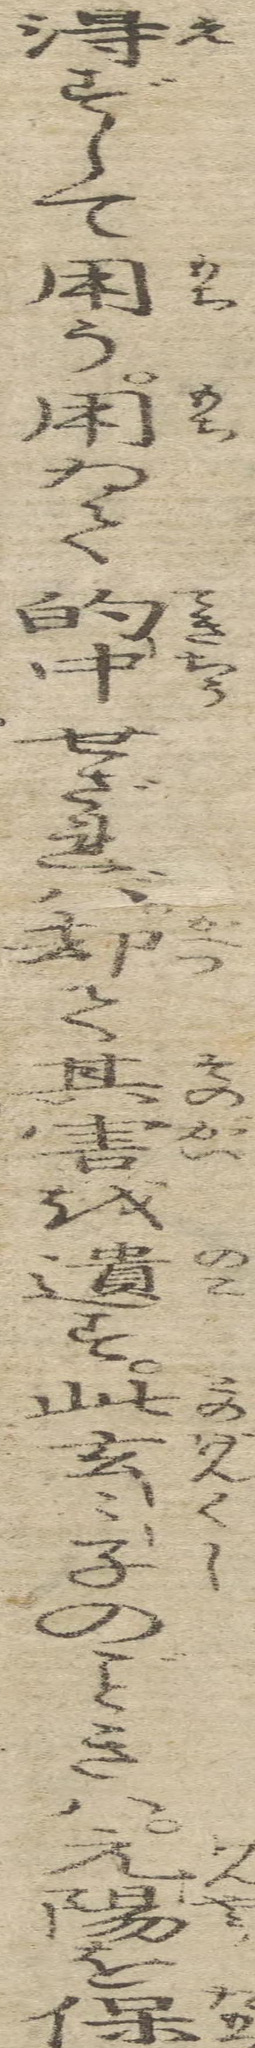得ずして用う。用ゐて的-中せざれば。却て其害を遺す。此玄-々-子のごときは。元-陽を保
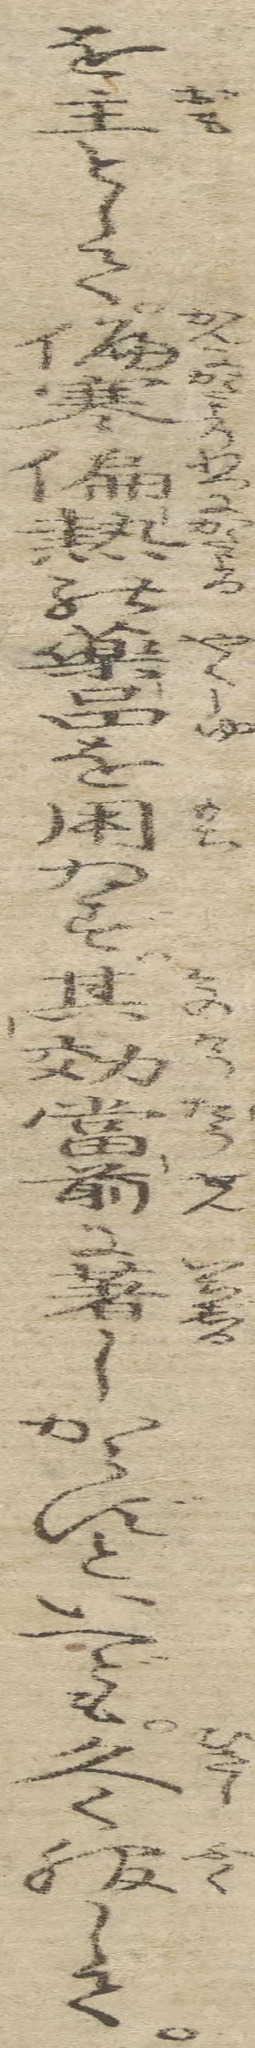を主として。偏寒偏-熱の薬-品を用ゐず。其-効當-前に著しからすといへども。久く服して。
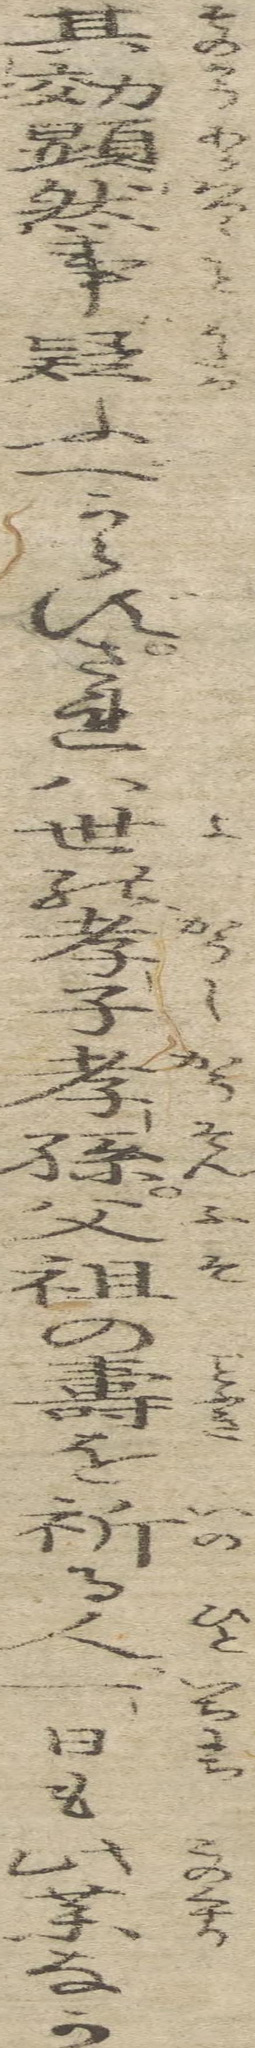其-効顕然事。疑ふべからず。されは世の孝-子孝-孫。父祖の寿を祈る人。一-日も此薬なか
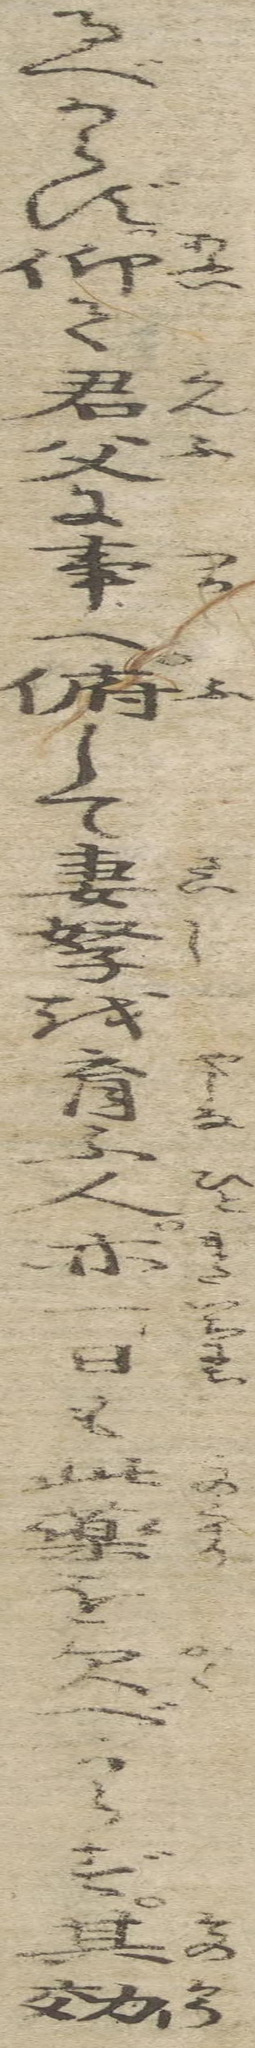るべからず。仰て君父に事へ。俯して妻孥を育ふ人。亦一-日も此薬を欠べからず。其効-

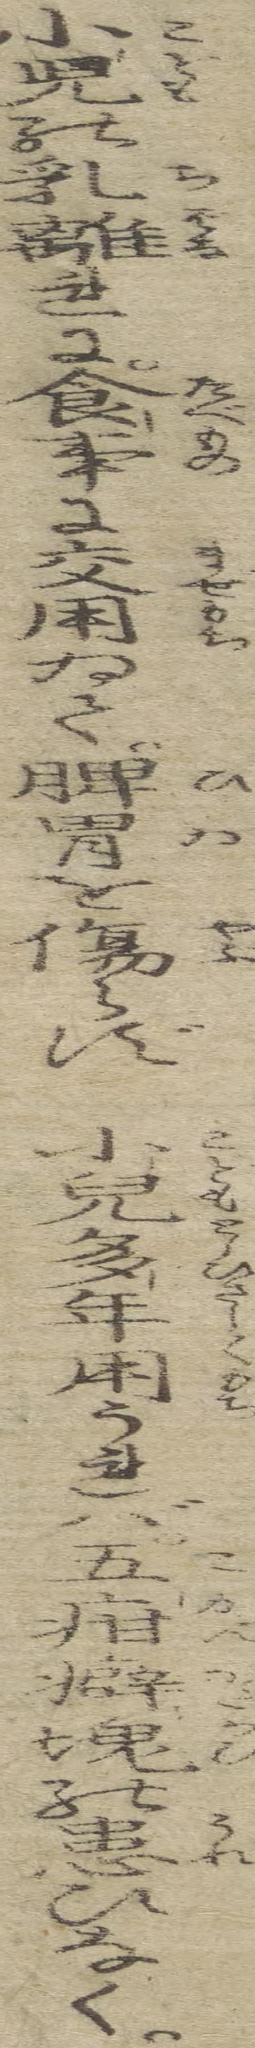小-児の乳-離れに。食-事に交用ゐて。脾胃を傷らず小-児多-年用うれば。五-疳癖-塊の患ひなく。
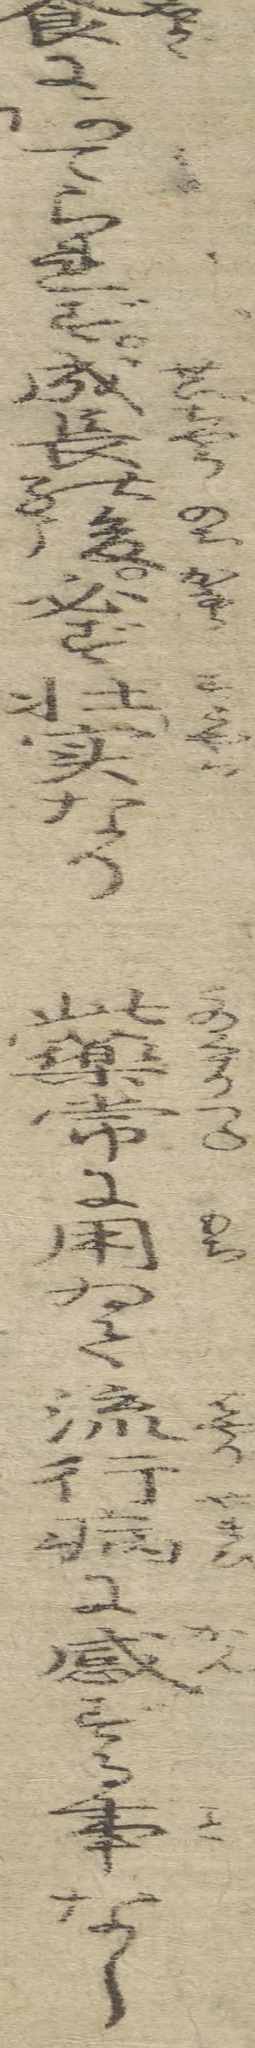食にあてられず。成長の後。必ず壮-実なり此-薬常に用ゐて流行病に感ずる事なし
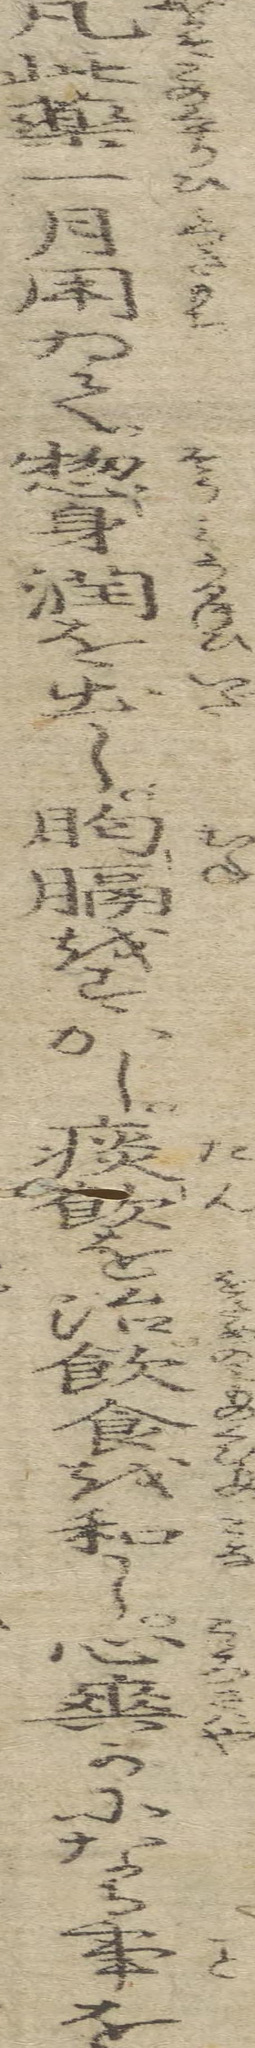凡此-薬一-月用ゐて。惣-身潤を出し。胸-膈をすかし。痰-飲を治。飲食を和し。心爽かになる事を
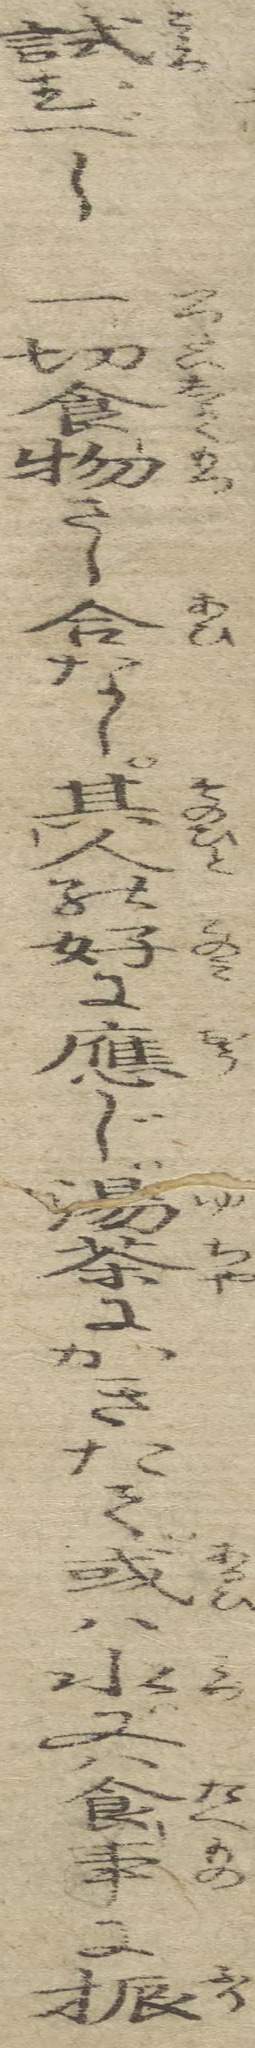試むべし一-切食-物さし合なし。其-人の好に応じ。湯茶にかきたて。或は水。又は食-事に振
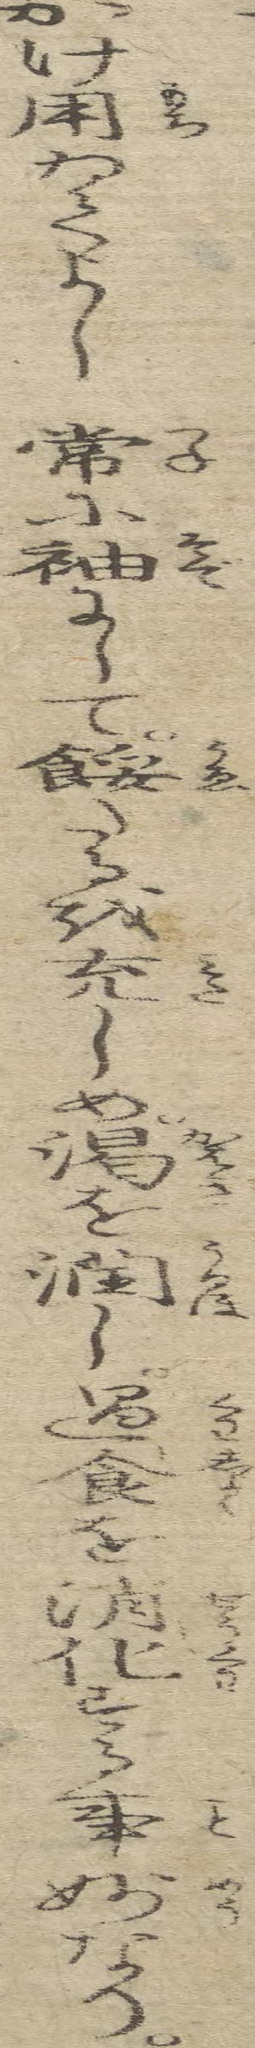かけ用ゐてよし常に袖にして。餒たるを充しめ。渇を潤し。過-食を消-化する事妙なり。
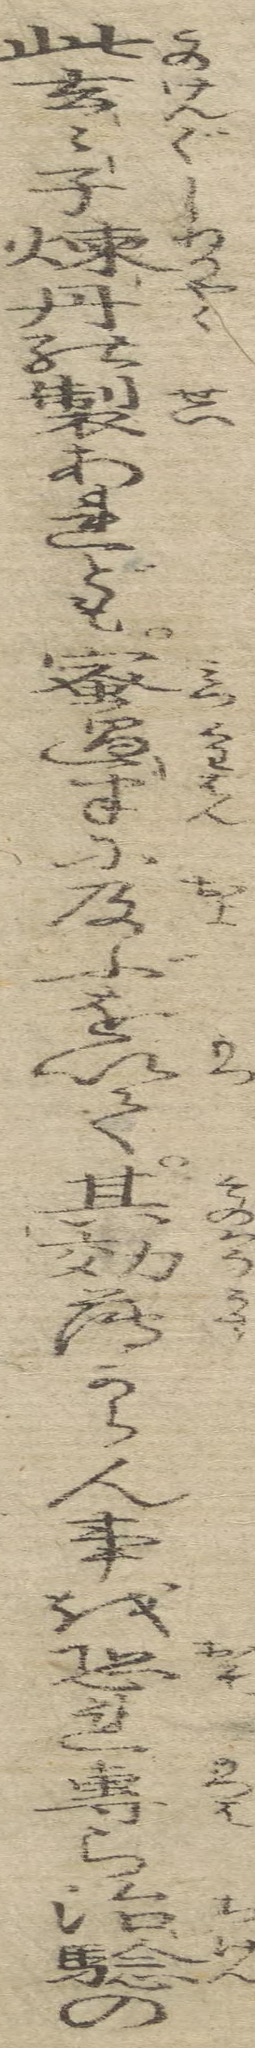此玄-々-子煉-丹の製あれども。蜜過-半に及ぶを以て。其-効薄からん事を恐れ専ら治-験の
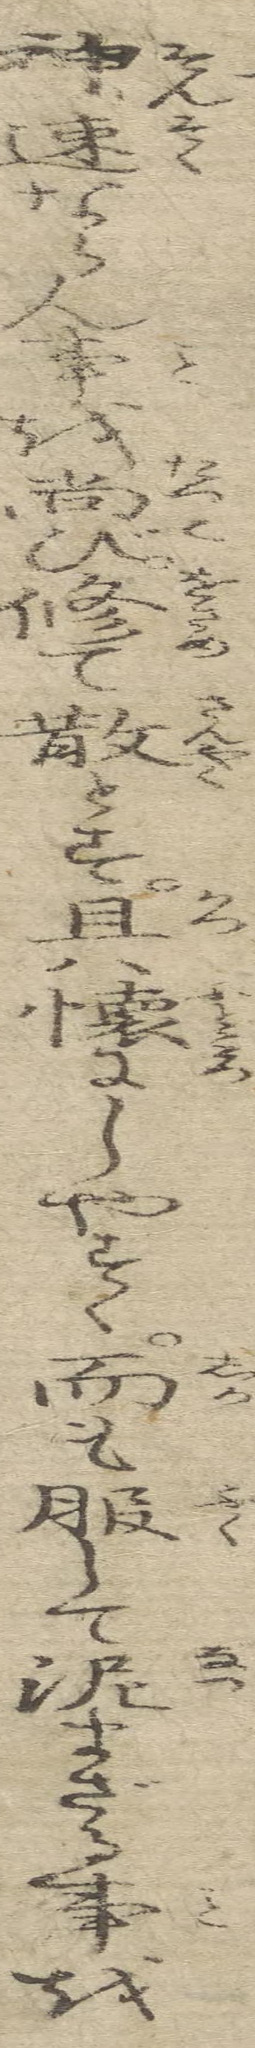神-速ならん事を尚び。修て散とす。且は懐にしやすく。而も服して泥まざる事を
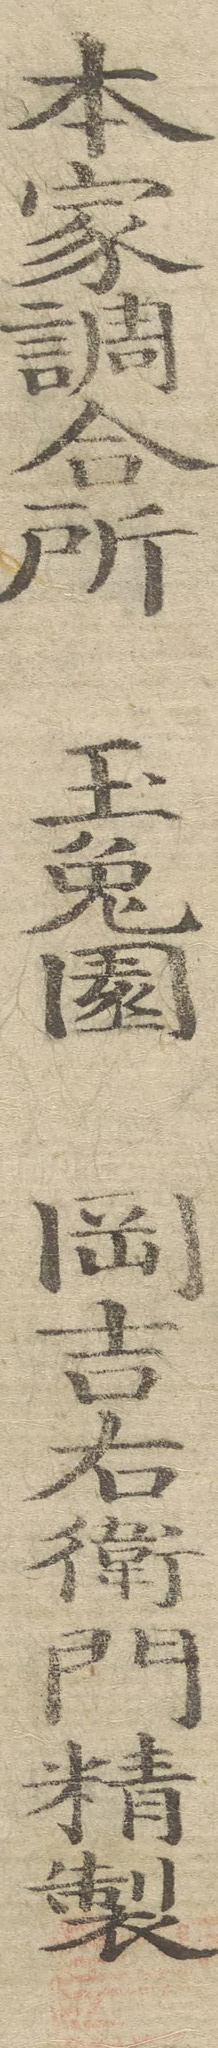本家調合所玉兎園岡吉右衛門精製
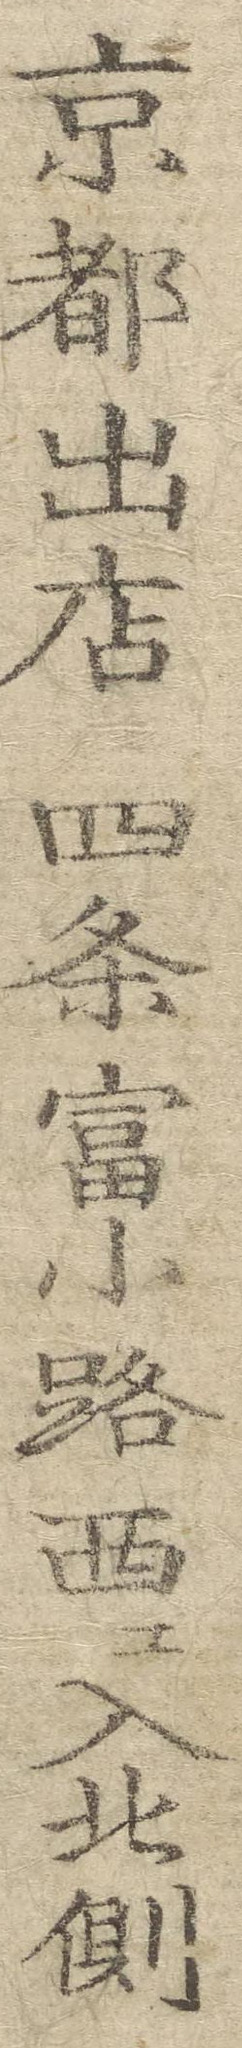京都出店四条富小路西ェ入北側
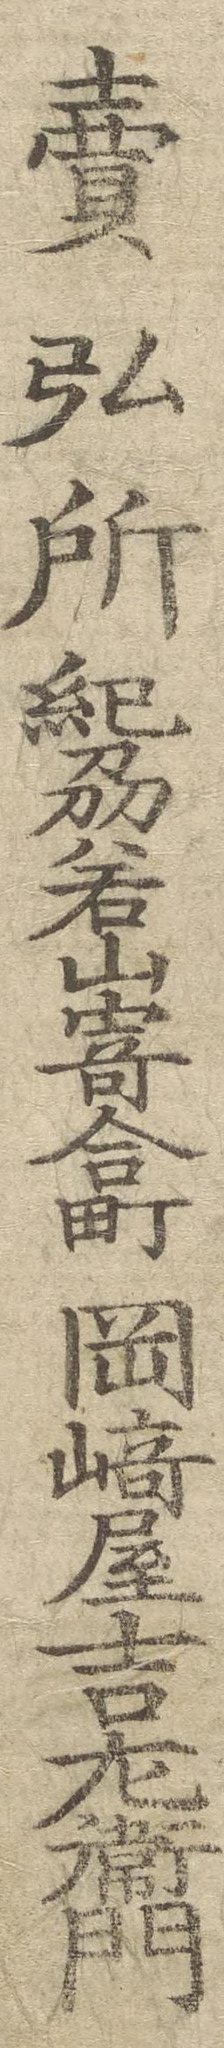売弘所紀刕若山寄合町岡崎屋吉左衛門
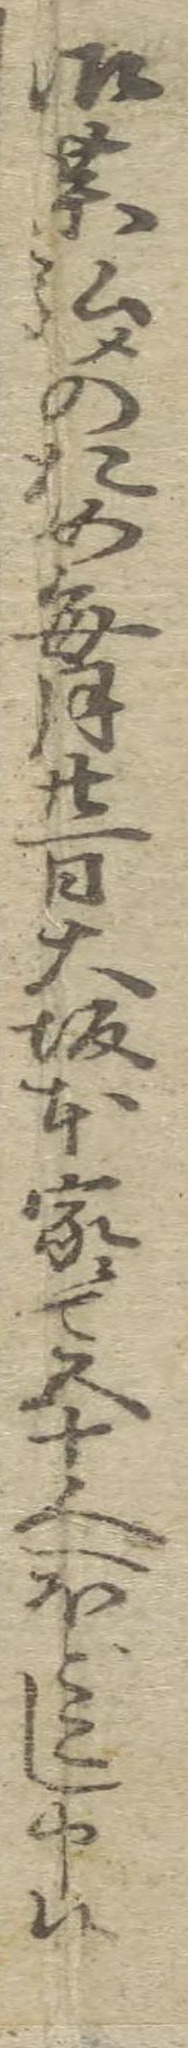御薬弘毎月廿一日大坂本家にて五十人へほどこし申候
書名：浪華薬種問屋能書張交帖. 二
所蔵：国立国会図書館 National Diet Library, JAPAN
